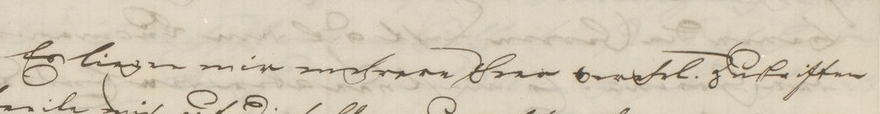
Es liegen mir mehrere Ihrer verehrl. Zuschriften
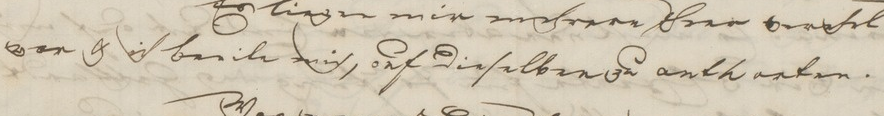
vor & ich beeile mich, auf dieselben zu antworten.
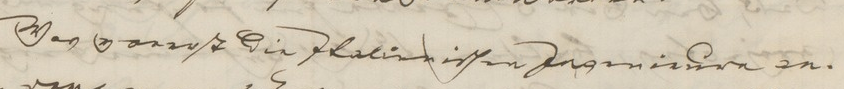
Was vorerst die Italienischen Ingenieure an-
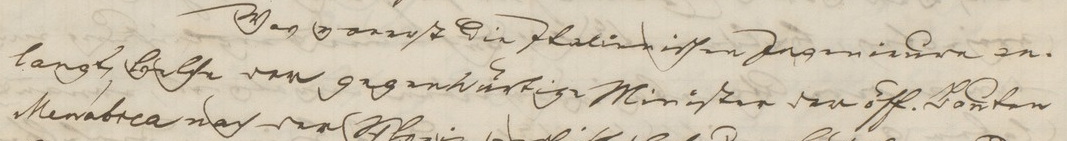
langt, welche der gegenwärtige Minister der öff. Bauten
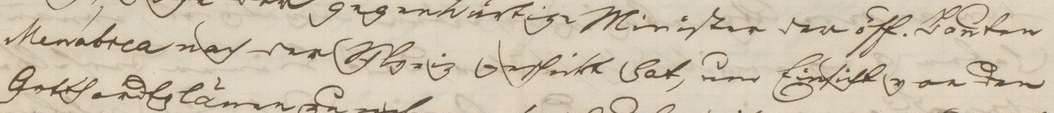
Menabrea nach der Schweiz geschickt hat, um Einsicht von den
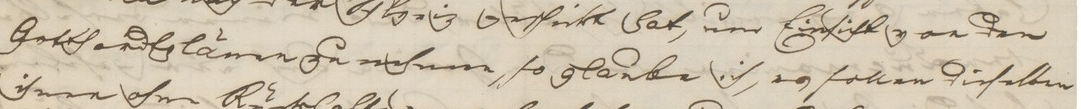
Gotthardtplänen zu nehmen, so glaube ich, es sollen dieselben
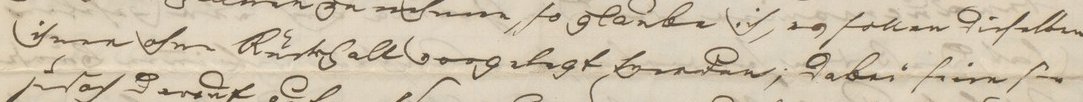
ihnen ohne Rückhalt vorgelegt werden; dabei seien sie
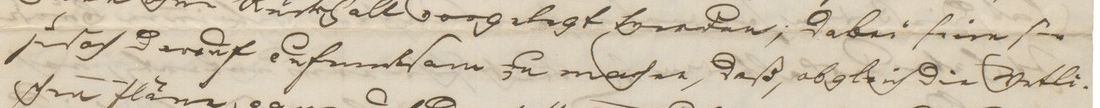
jedoch darauf aufmerksam zu machen, daß, obgleich die Wetli -
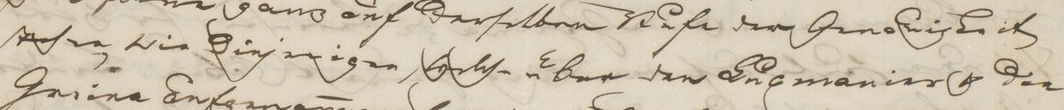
stehen, wie diejenigen, welche über den Lucmanier & die
